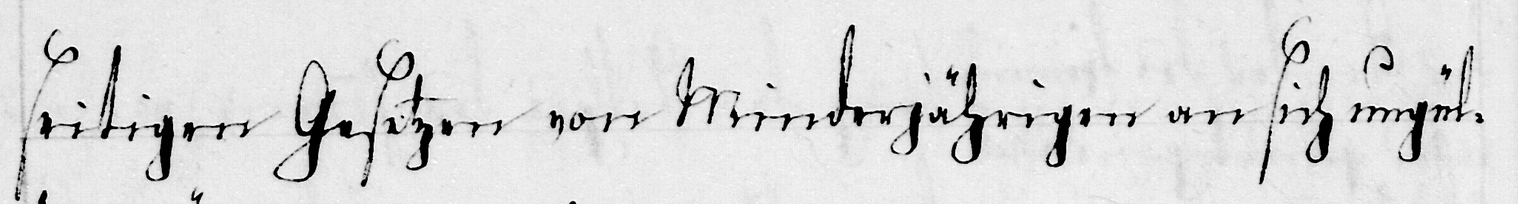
seitigen Gesetzen von Minderjährigen an sich ungül¬
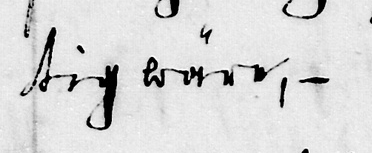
tig wäre, –
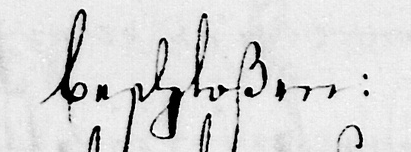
beschloßen:
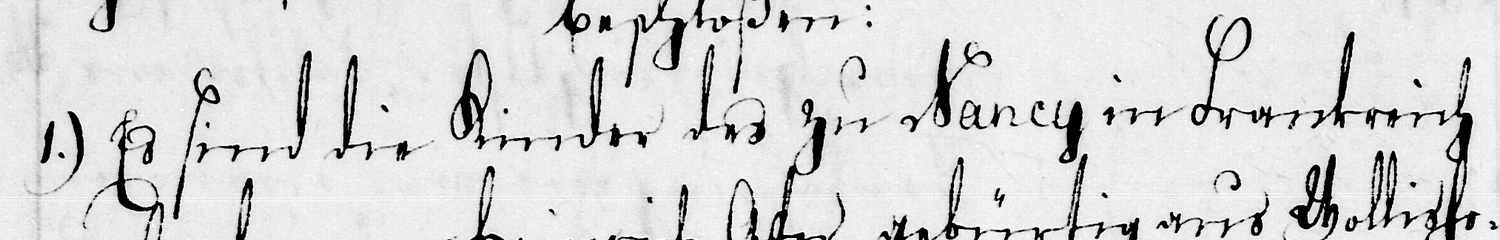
1.) Es sind die Kinder des zu Nancy in Frankreich
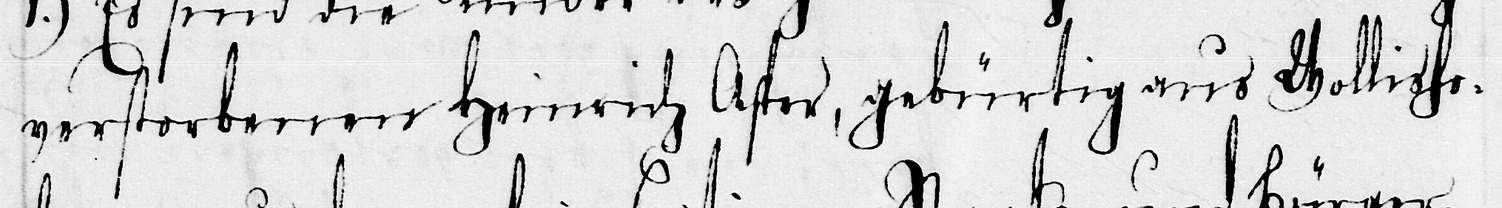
verstorbenen Heinrich Asper, gebürtig aus Wollisho¬
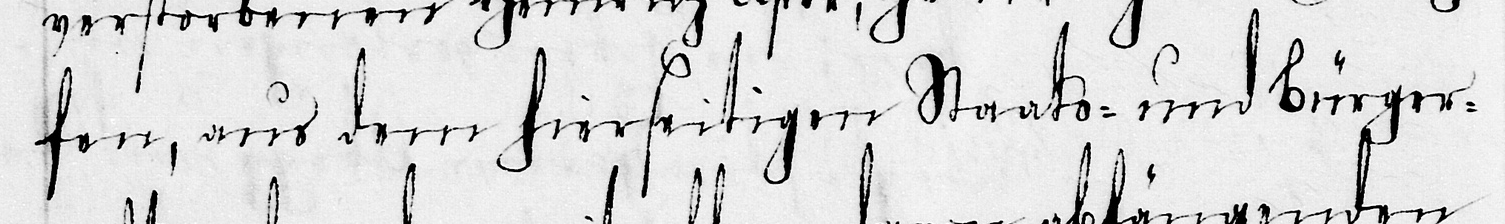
fen, aus dem hierseitigen Staats- und Bürger¬
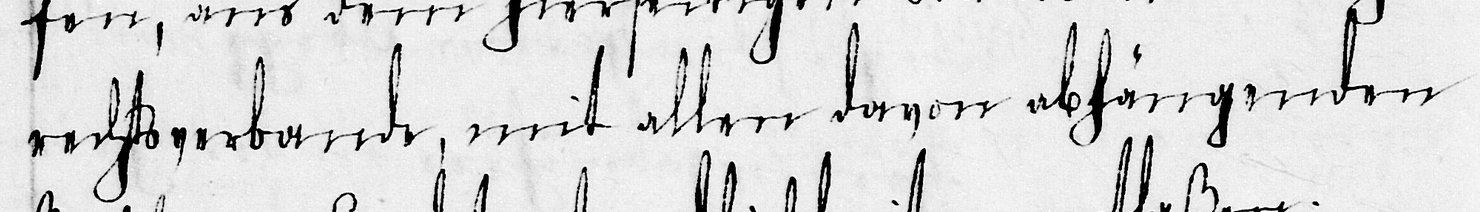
rechtsverbande, mit allen davon abhängenden
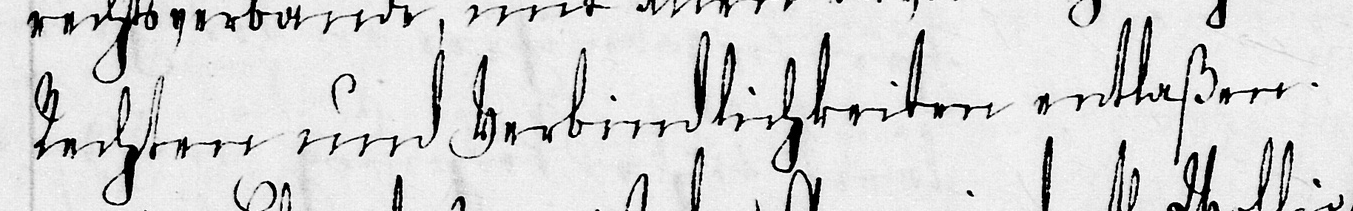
Rechten und Verbindlichkeiten entlaßen.
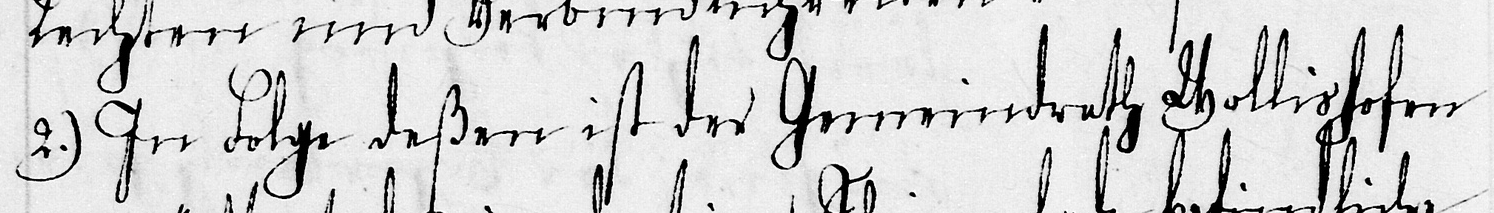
2.) In Folge deßen ist der Gemeindrath Wollishofen
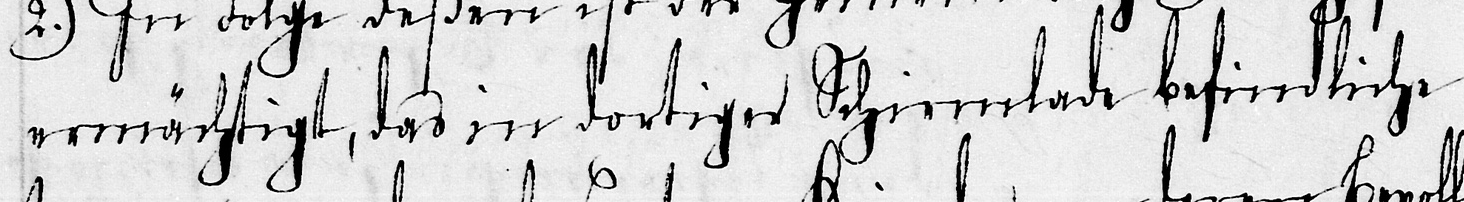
ermächtigt, das in dortiger Schirmlade befindliche
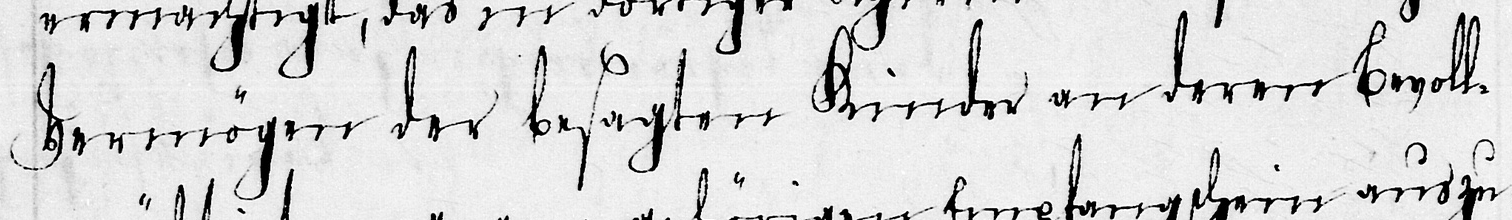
Vermögen der besagten Kinder an deren Bevol¬
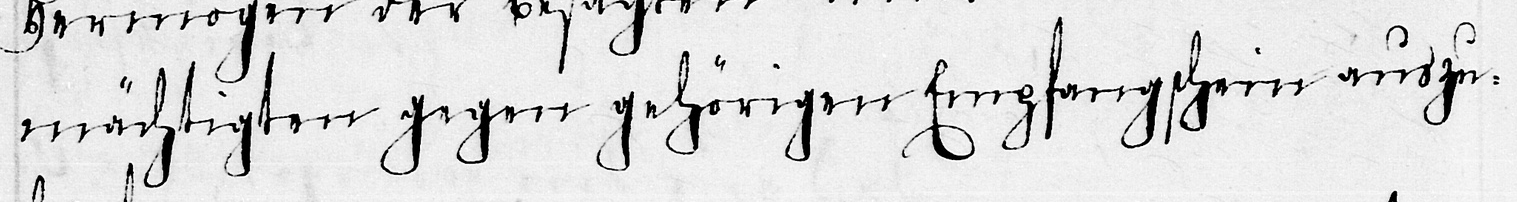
lmächtigten gegen gehörigen Empfangschein auszu¬
